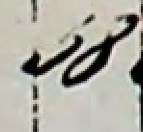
58
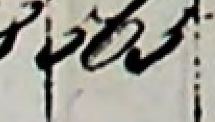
565
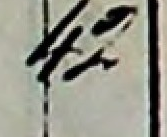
42
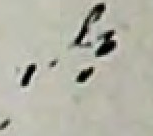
Do
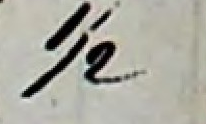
1/2
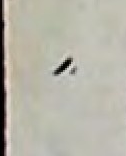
„
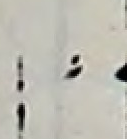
„
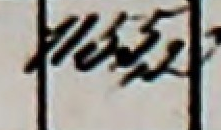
1155,2
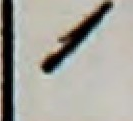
1
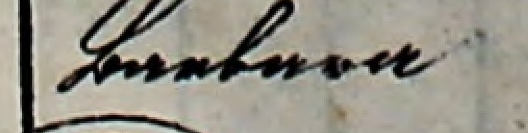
Barbara
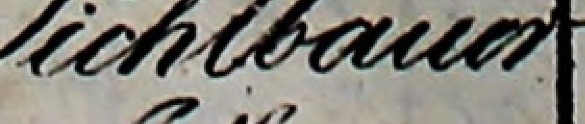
Pichlbauer
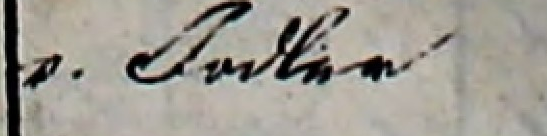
v. Jodler
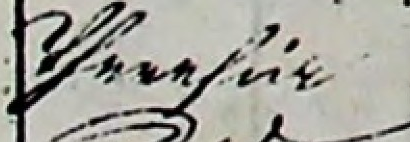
Theresia
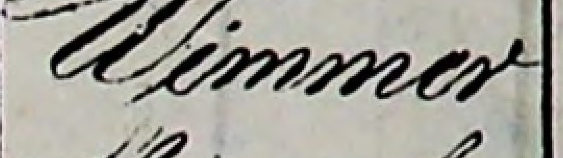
Wimmer
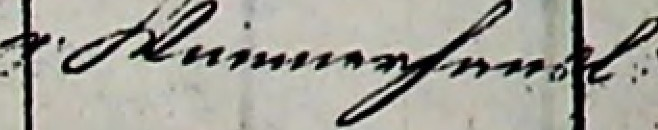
v. Wimmerhaasl
